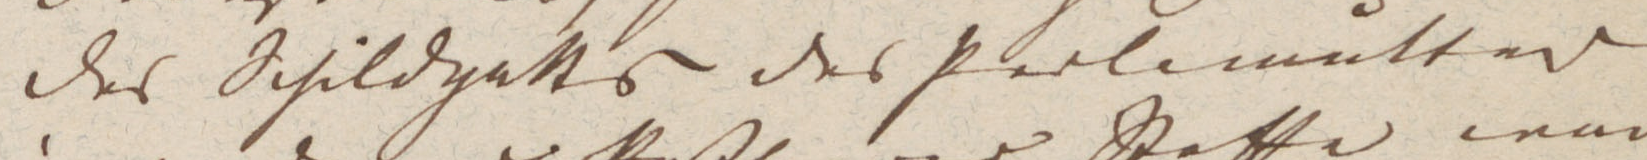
des Schildpatts des Perlemutter
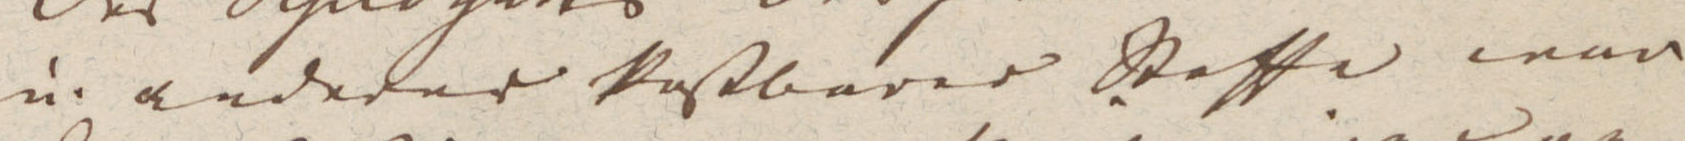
u. anderer kostbarer Stoffe war
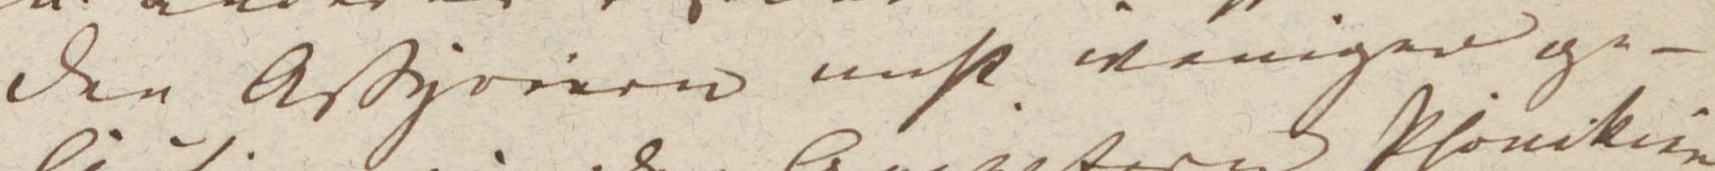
den Assyriern nicht weniger ge-
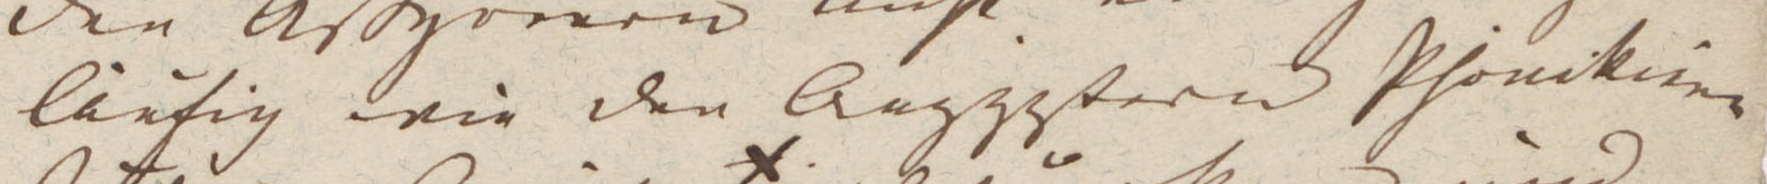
läufig wie den Aegyptern Phönikiern
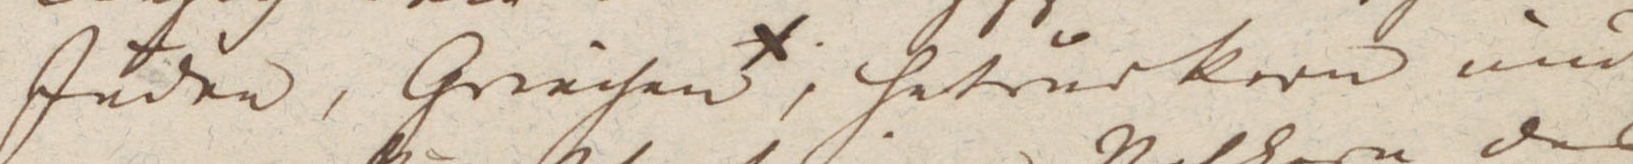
Juden, Griechen %; Hetruskern und
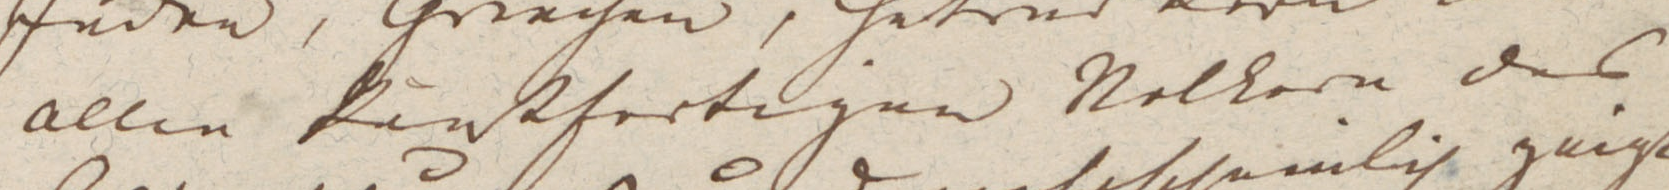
allen kunstfertigen Volkern des
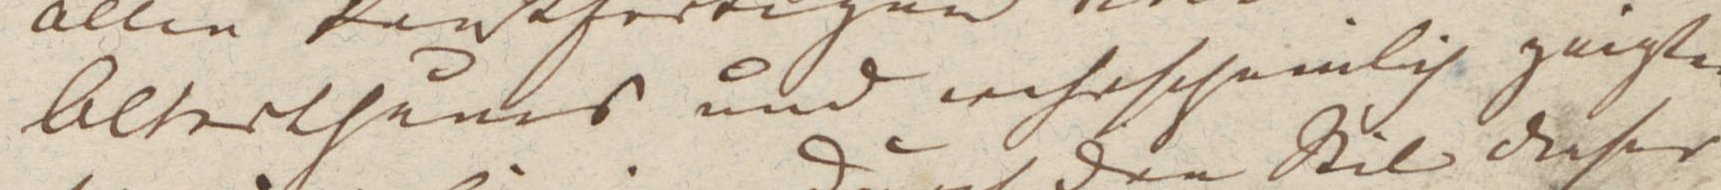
Alterthums und wahrscheinlich zeigten
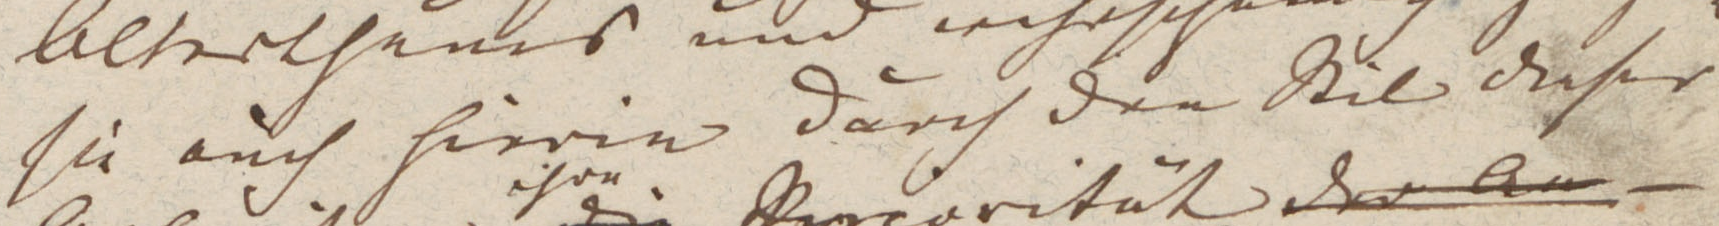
sie auch hierin durch den Stil dieser
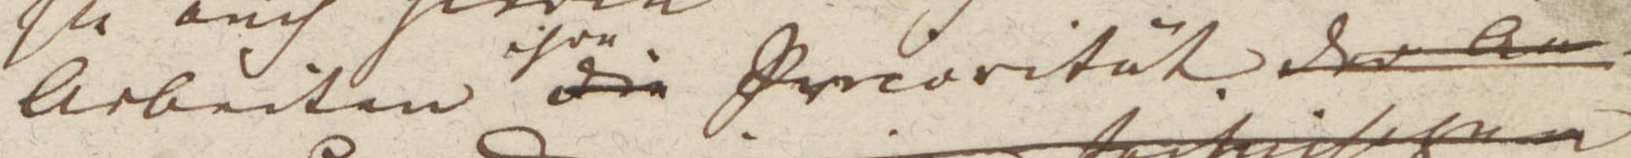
Arbeiten die ihre Priorität. der An-
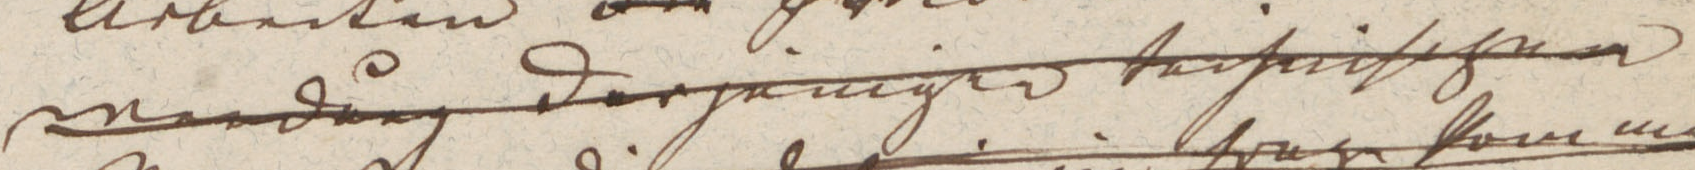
wendung derjenigen technischen
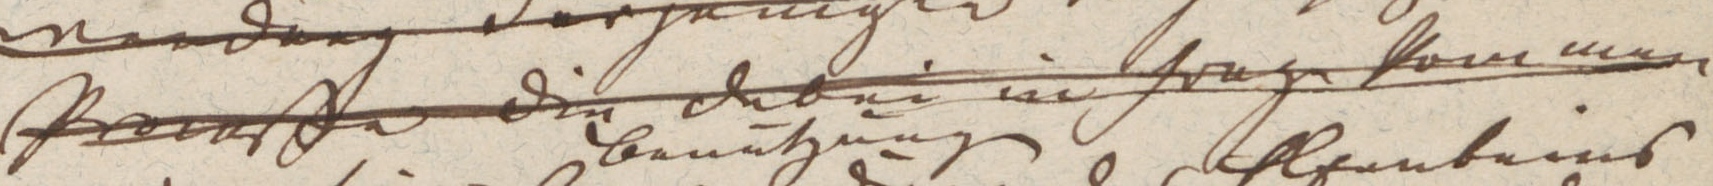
Processe die dabei in Frage kommen
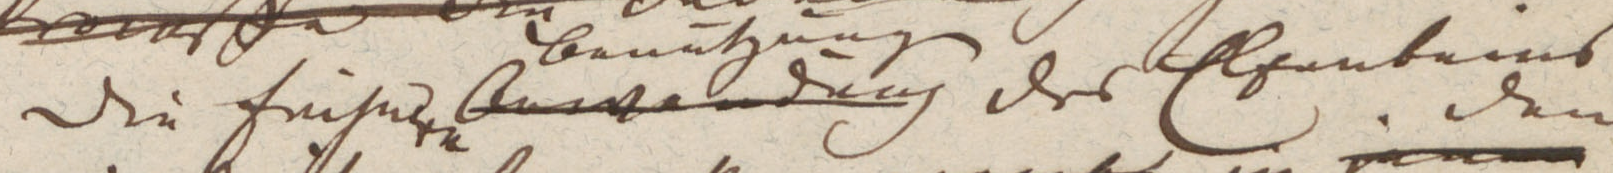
Die frühere Anwendung Benutzung des Elfenbeins
